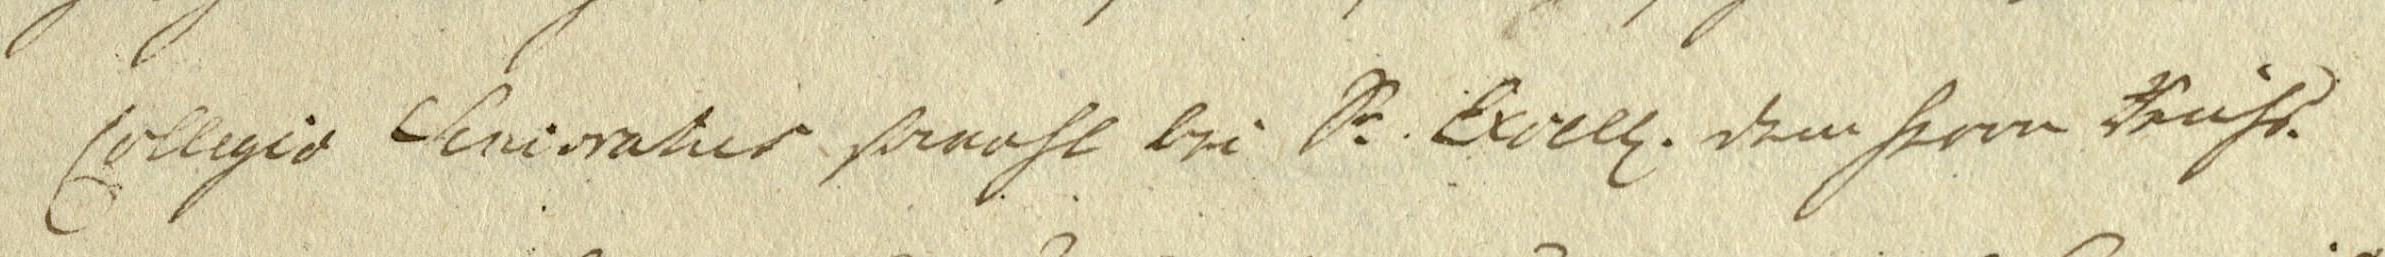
Collegio Senioratus sowohl bei Sr. Excell. dem Herrn Reichs¬
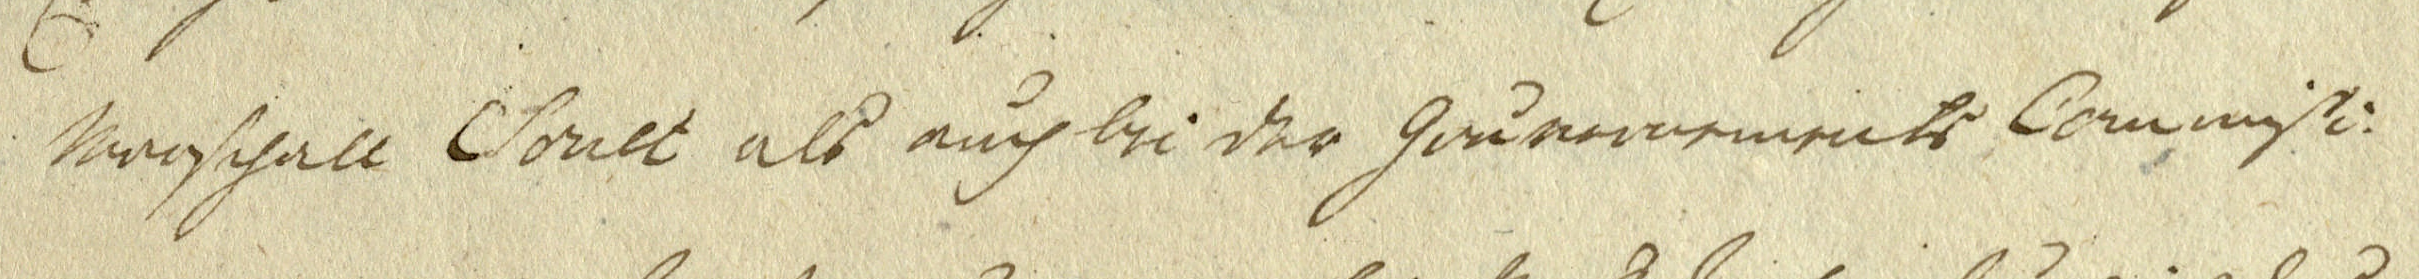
Marschall Soult als auch bei der Gouvernements Commissi¬
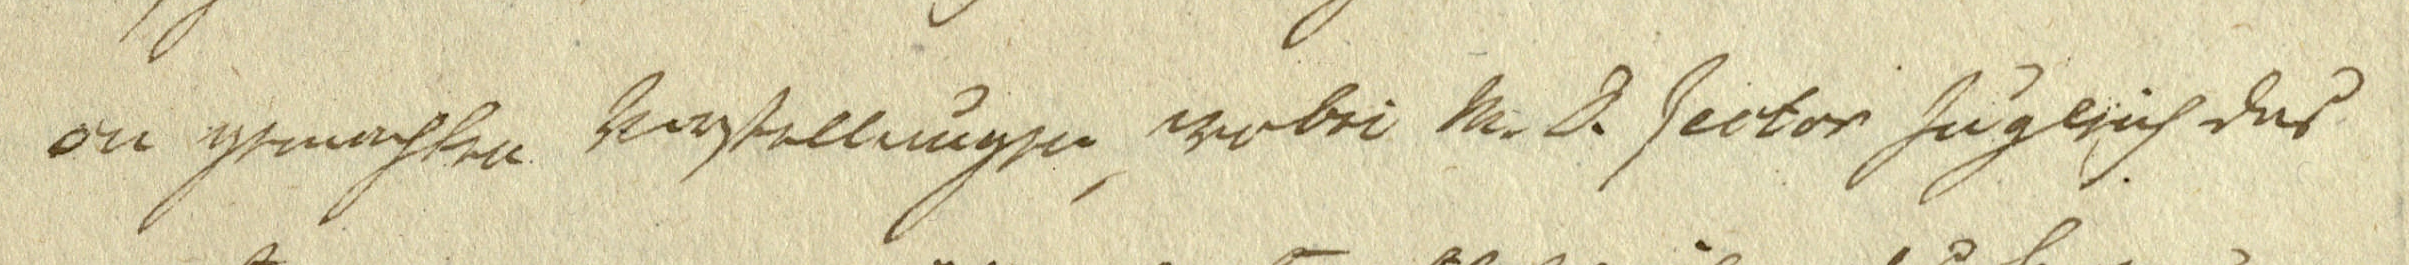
on gemachten Vorstellungen wobei M. D. Rector zugleich das
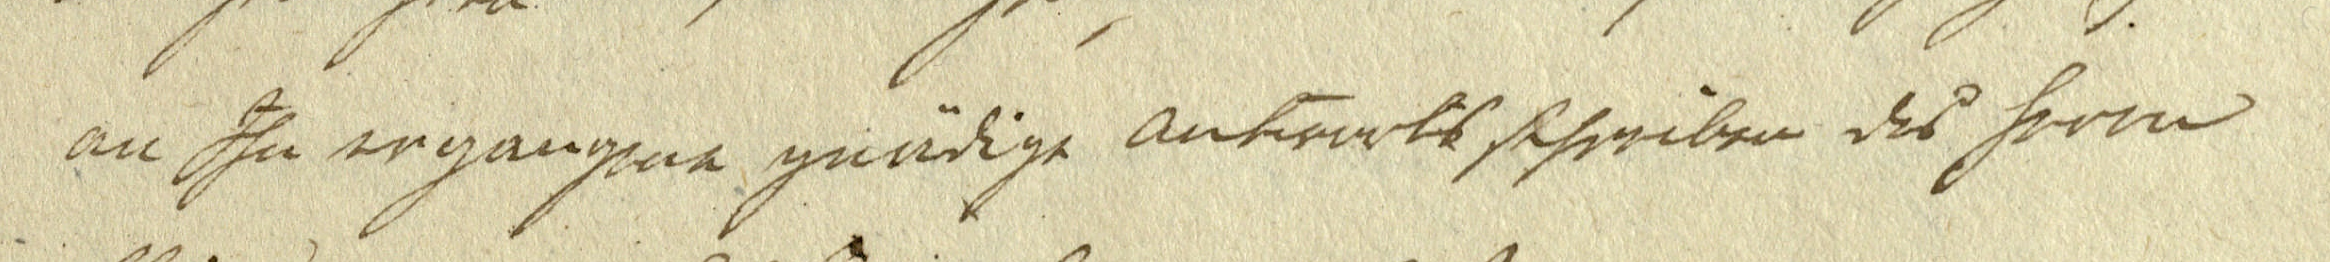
an Ihn ergangene gnädige Antwortsschreiben des Herrn
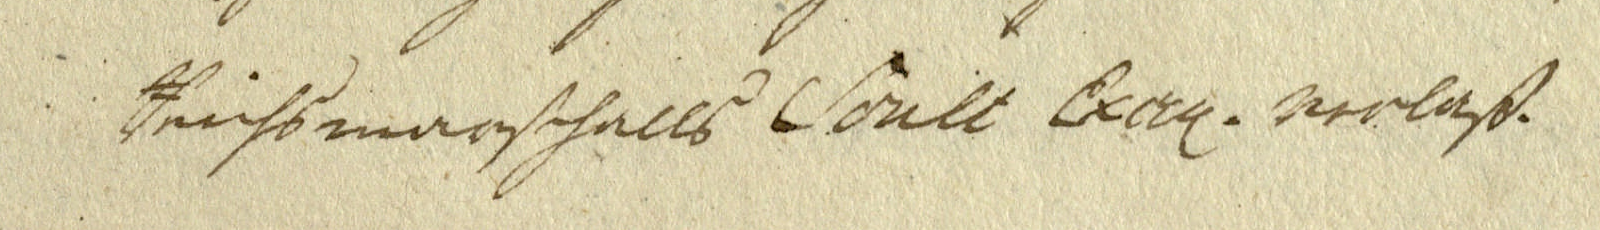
Reichsmarschalls Soult Excell. verlas.
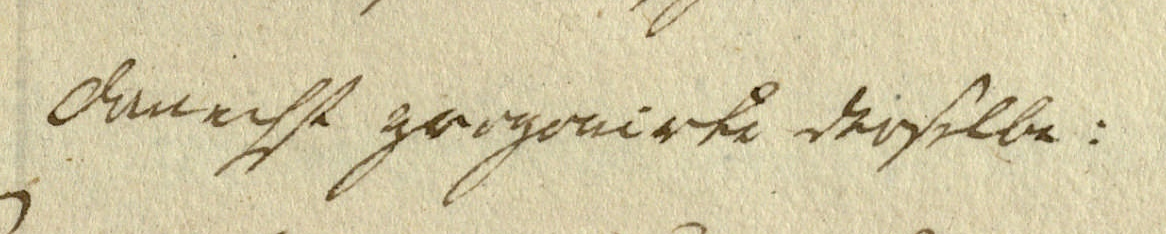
Danechst proponirte derselbe:
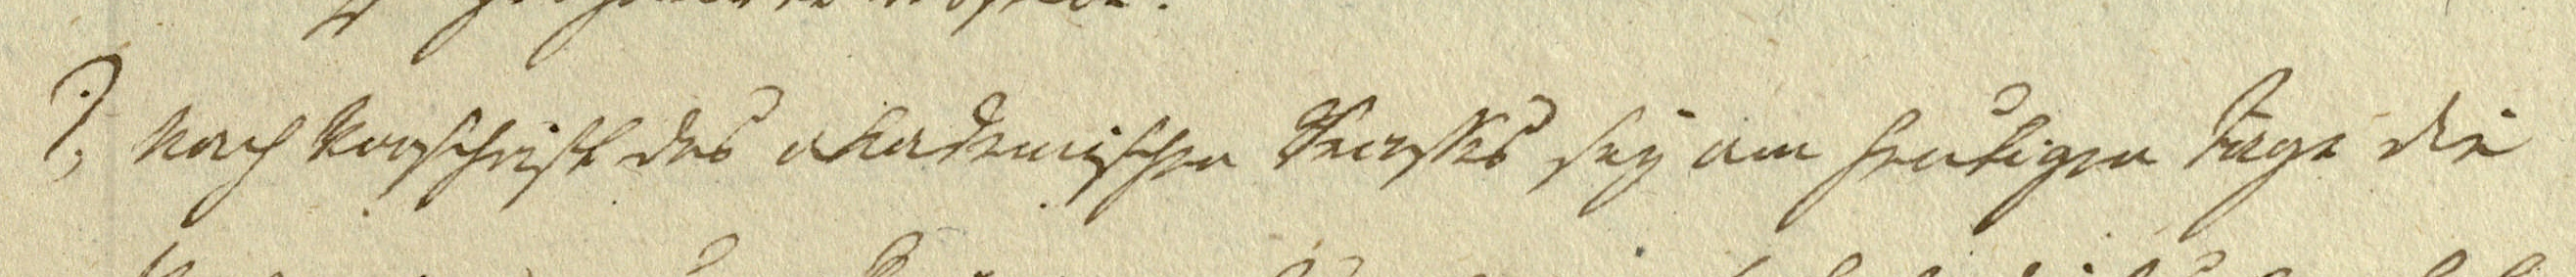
1. Nach Vorschrift des akademischen Recesses seÿ am heutigen Tage die
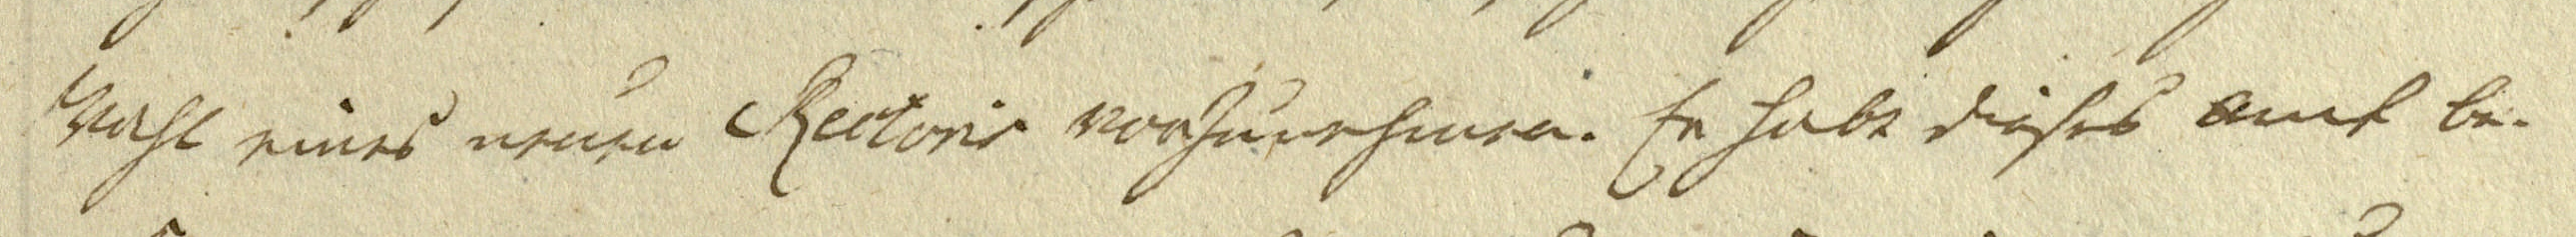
Wahl eines neuen Rectoris vorzunehmen. Er habe dieses Amt be¬
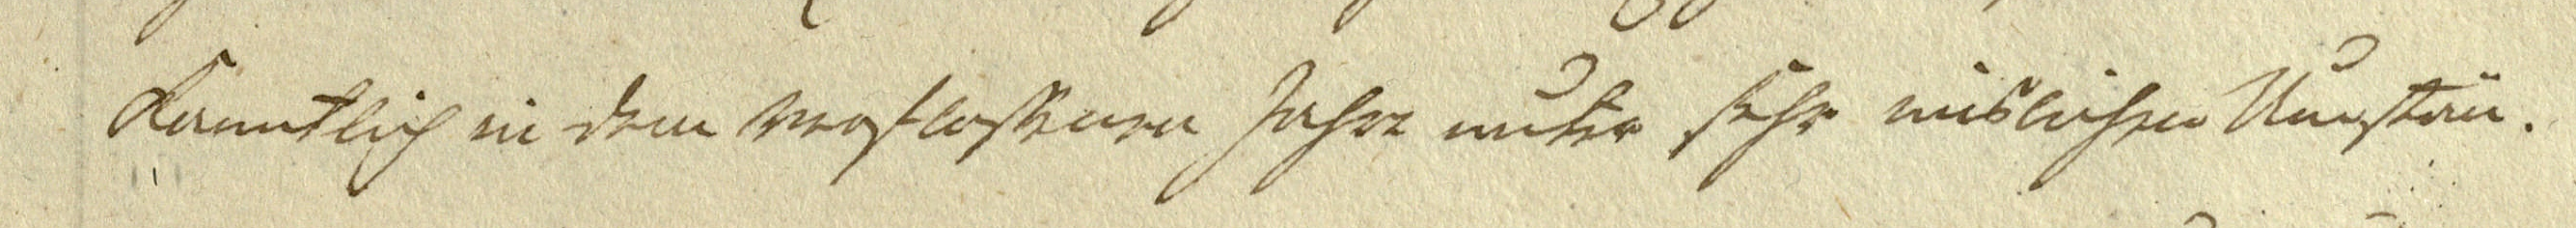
kanntlich in dem verflossenen Jahre unter sehr mislichen Umstän¬
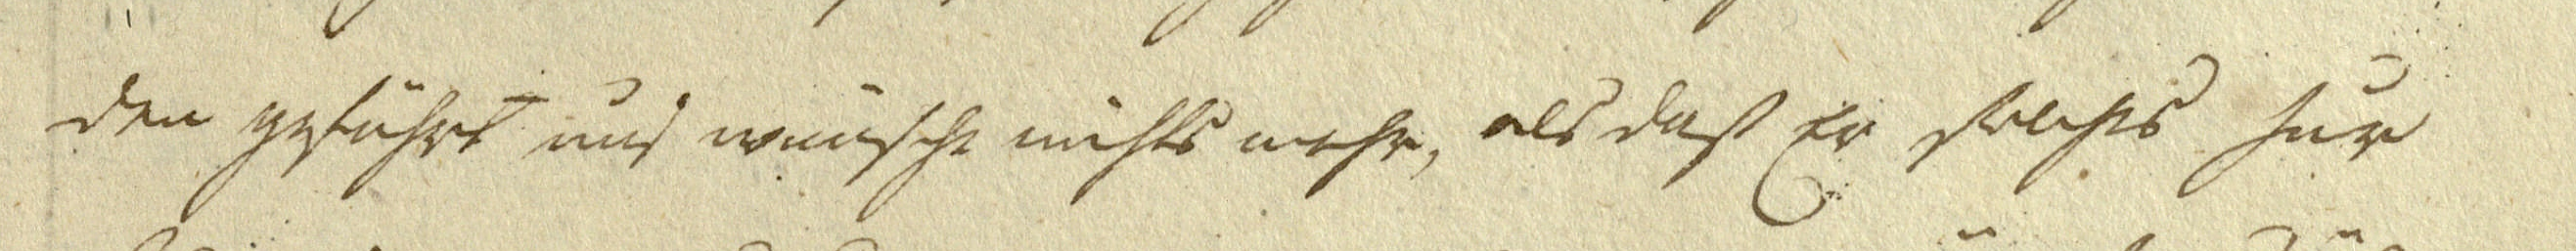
den geführt und wünsche nichts mehr, als daß Er solches zur
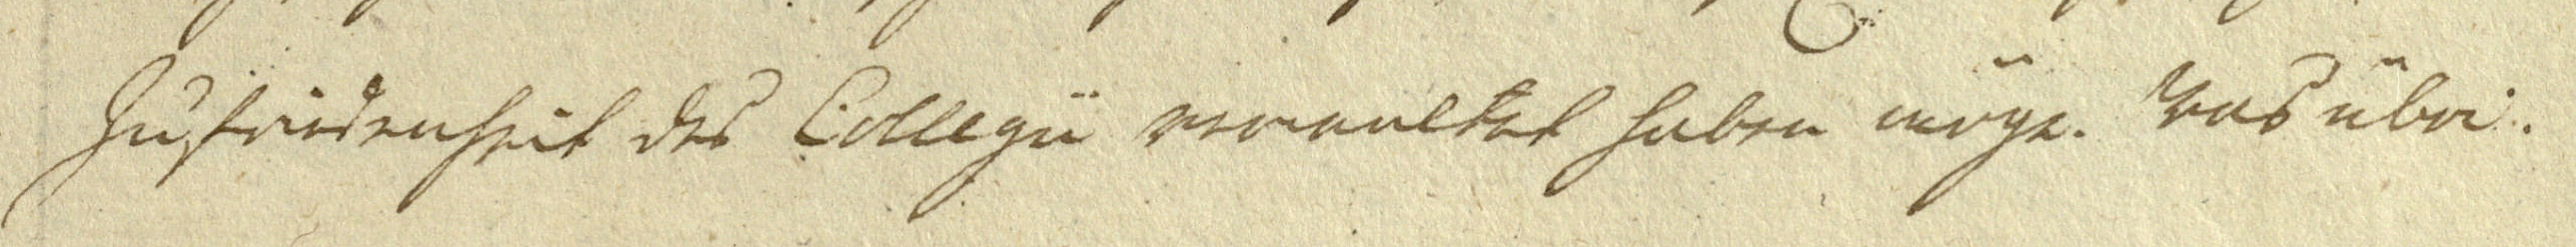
Zufriedenheit des Collegii verwaltet haben möge. Was übri¬
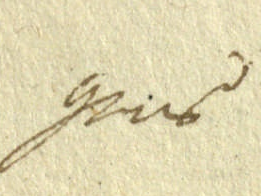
gens
